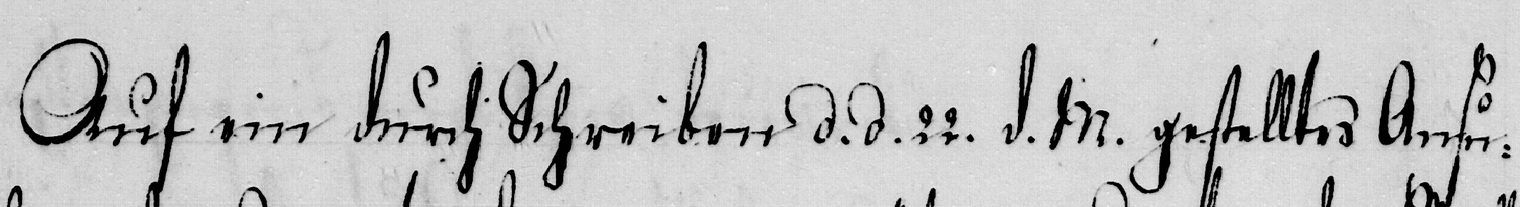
Auf ein durch Schreiben d. d. 22. d. M. gestelltes
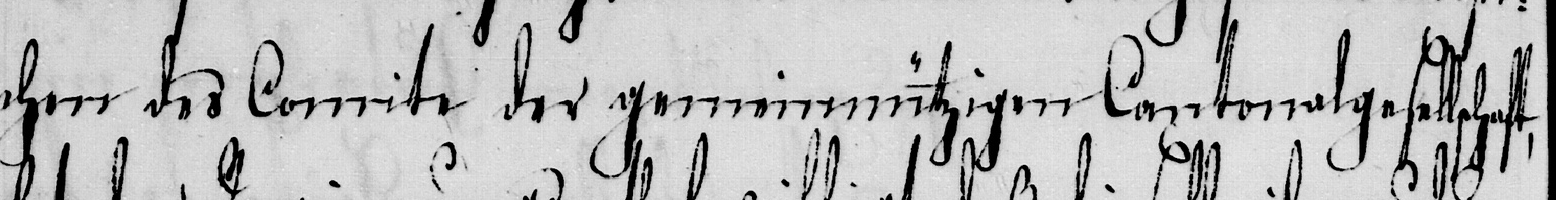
chen des Comite der gemeinnützigen Cantonalgesellscha¬
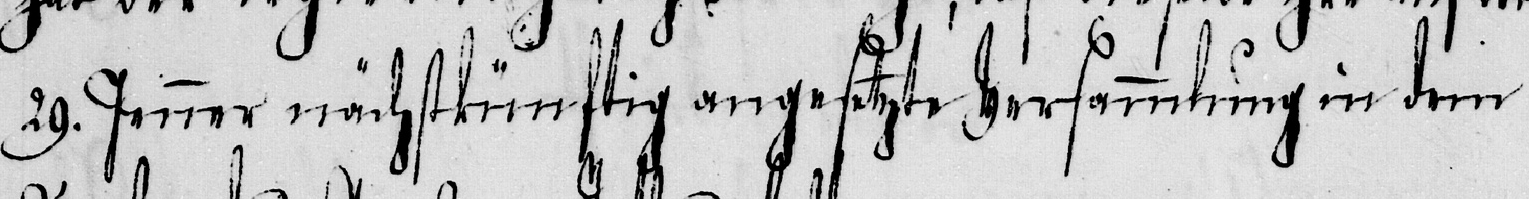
29. Jenner nächstkünftig angesetzte Versammlung in dem
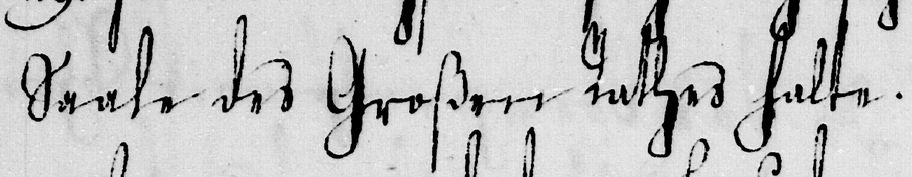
Saale des Großen Rathes halte.
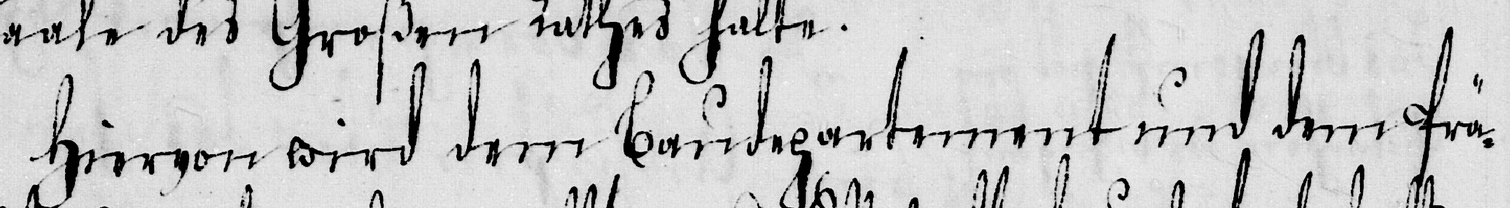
Hiervon wird dem Baudepartement und dem Prä¬
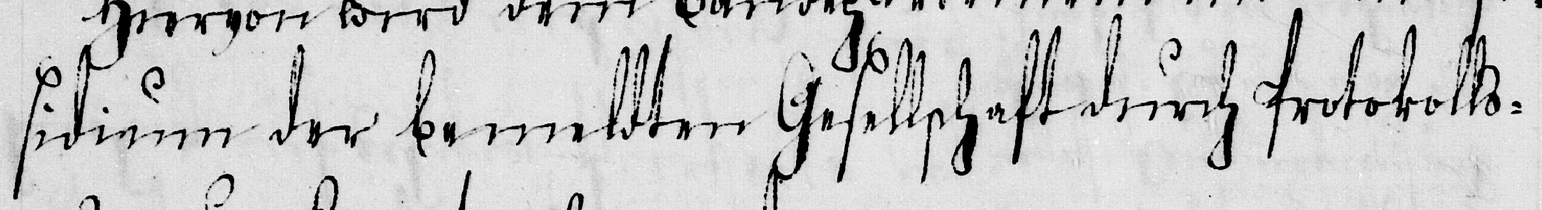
sidium der bemeldten Gesellschaft durch Protokoll¬
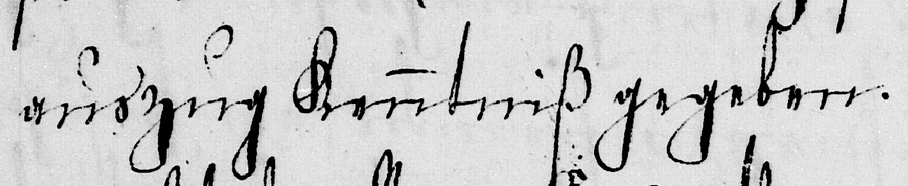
sauszug Kenntniß gegeben.
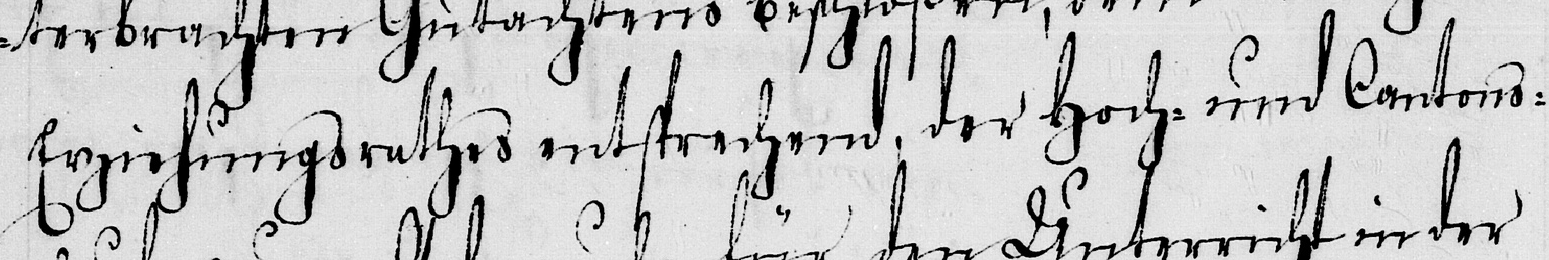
Erziehungsrathes entsprechend, der Hoch- und Cantons¬
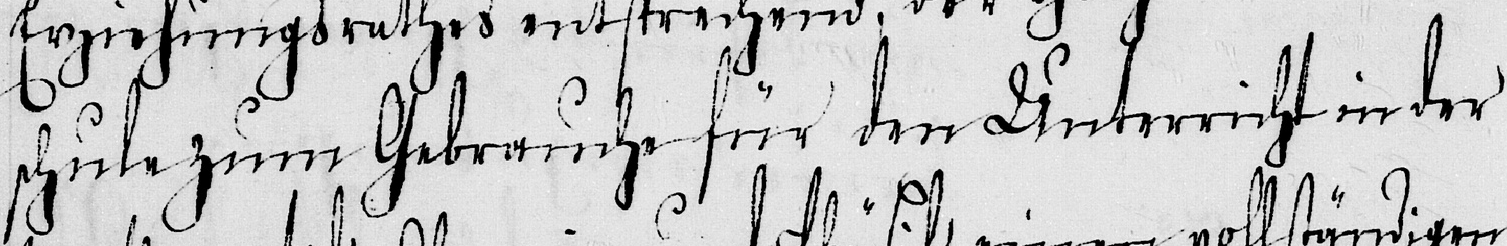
schule zum Gebrauche für den Unterricht in der
